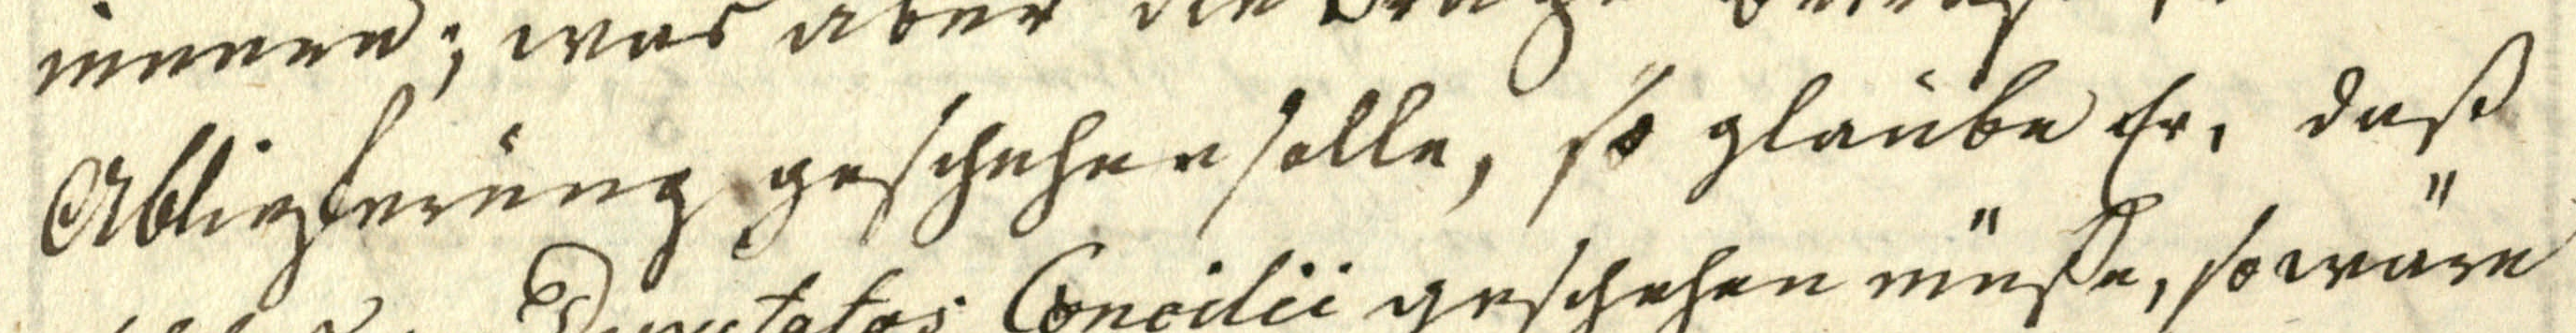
Ablieferung geschehen solle, so glaube Er, daß
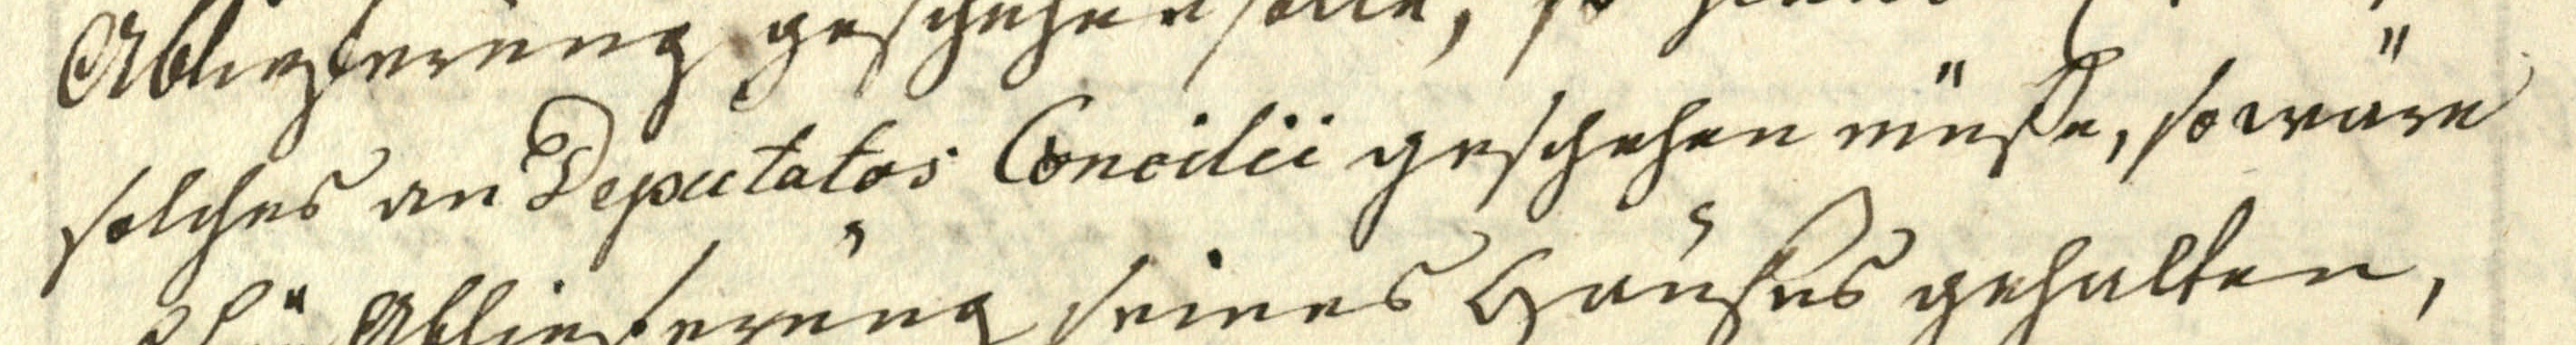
solches an Deputatos Concilii geschehen müße, so wäre
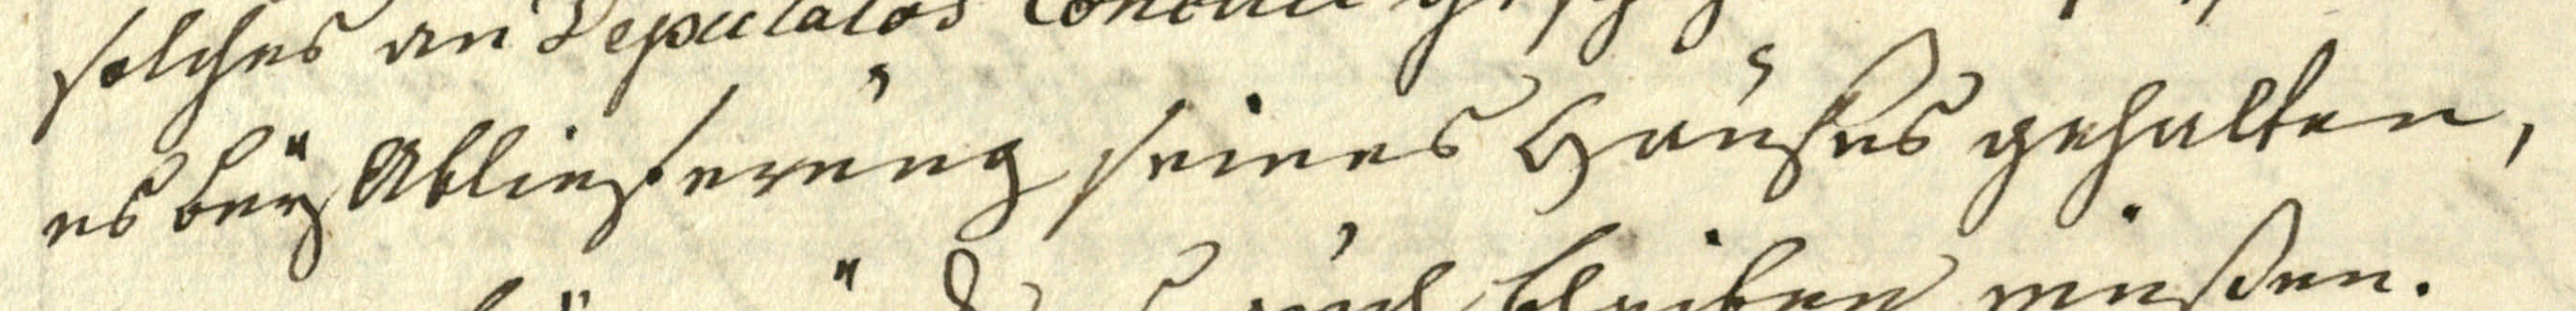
es beÿ Ablieferung seines Haußes gehalten,
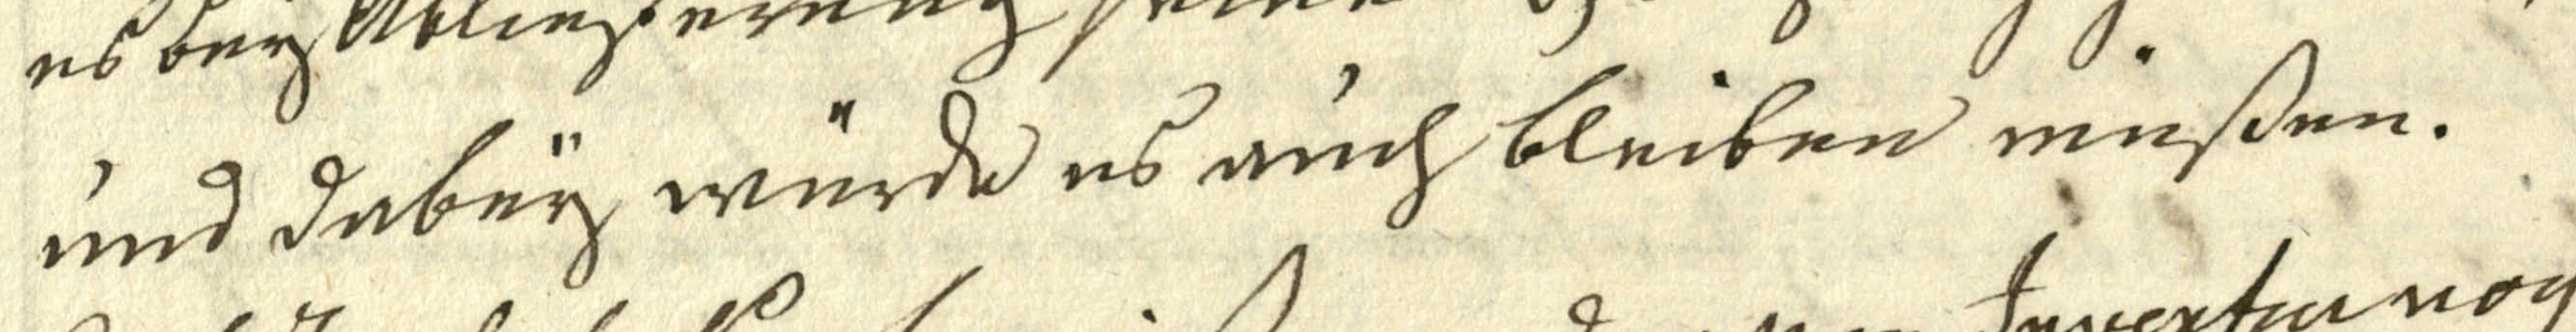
und dabeÿ würde es auch bleiben müßen.
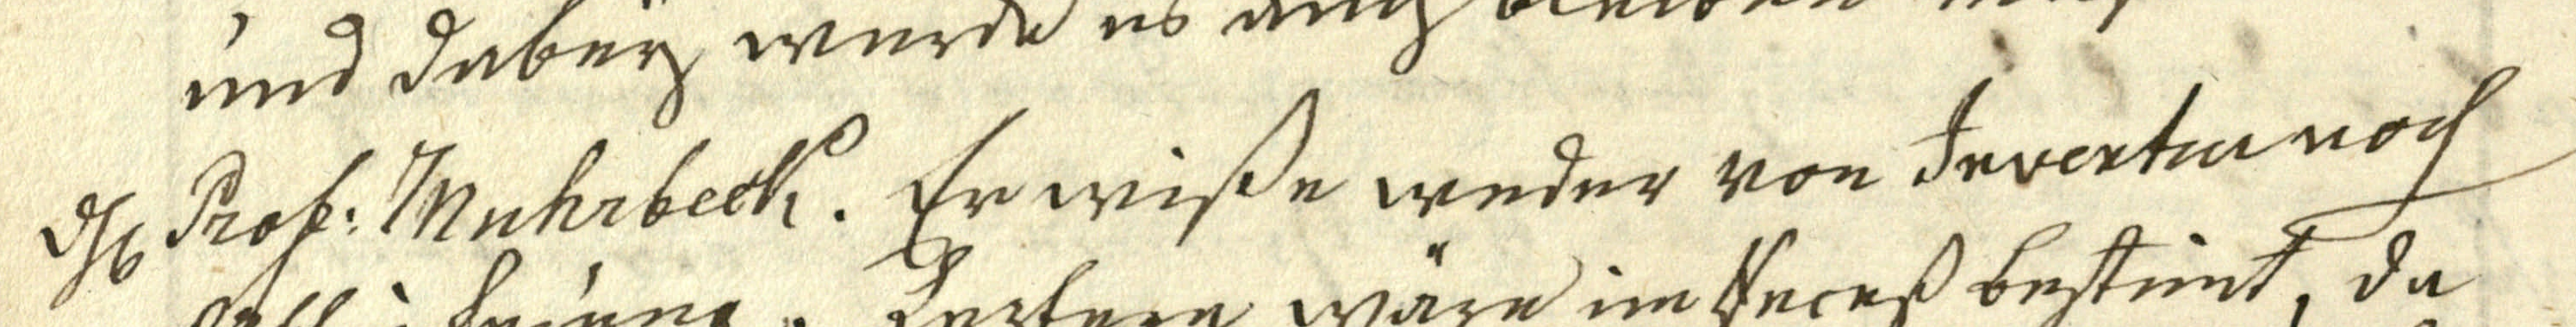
dh Prof. Muhrbeck. Er wiße weder von Inventur noch
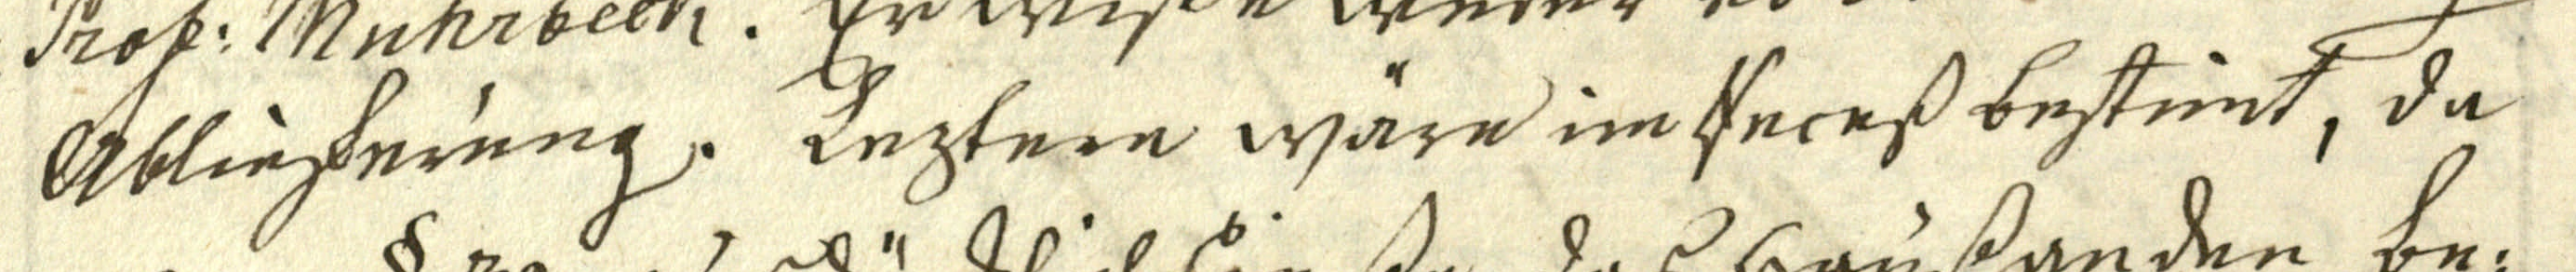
Ablieferung. Leztere wäre in Receß bestimt, da
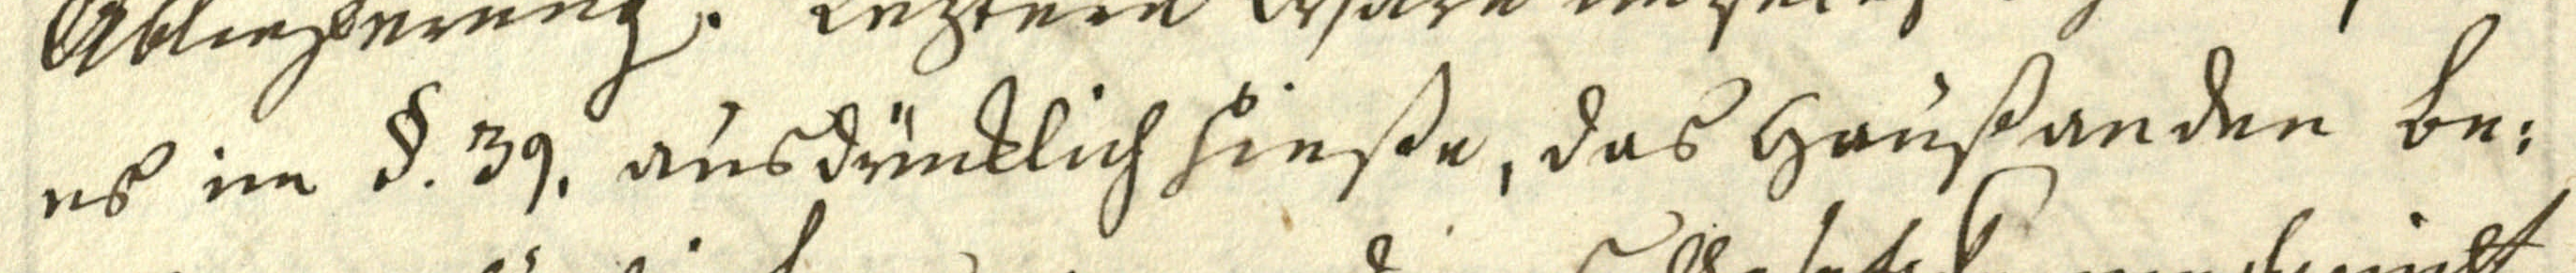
es im §. 39. ausdrücklich hieße, das Hauß an den Be¬
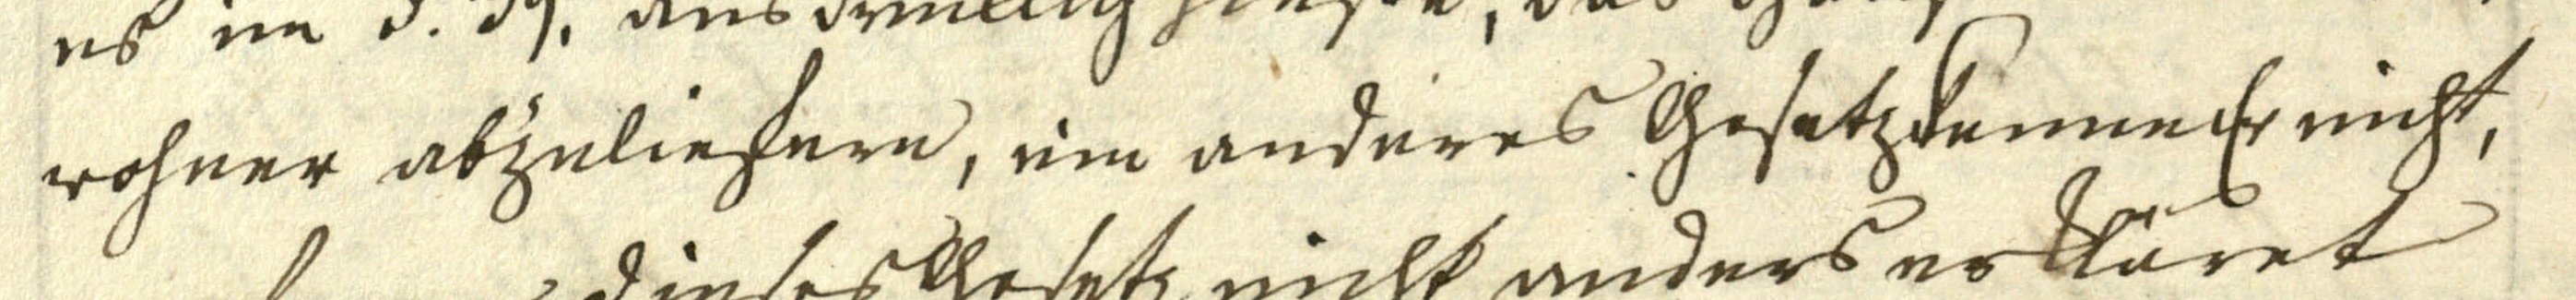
wohner abzuliefern, ein anderes Gesetz kenne Er nicht,
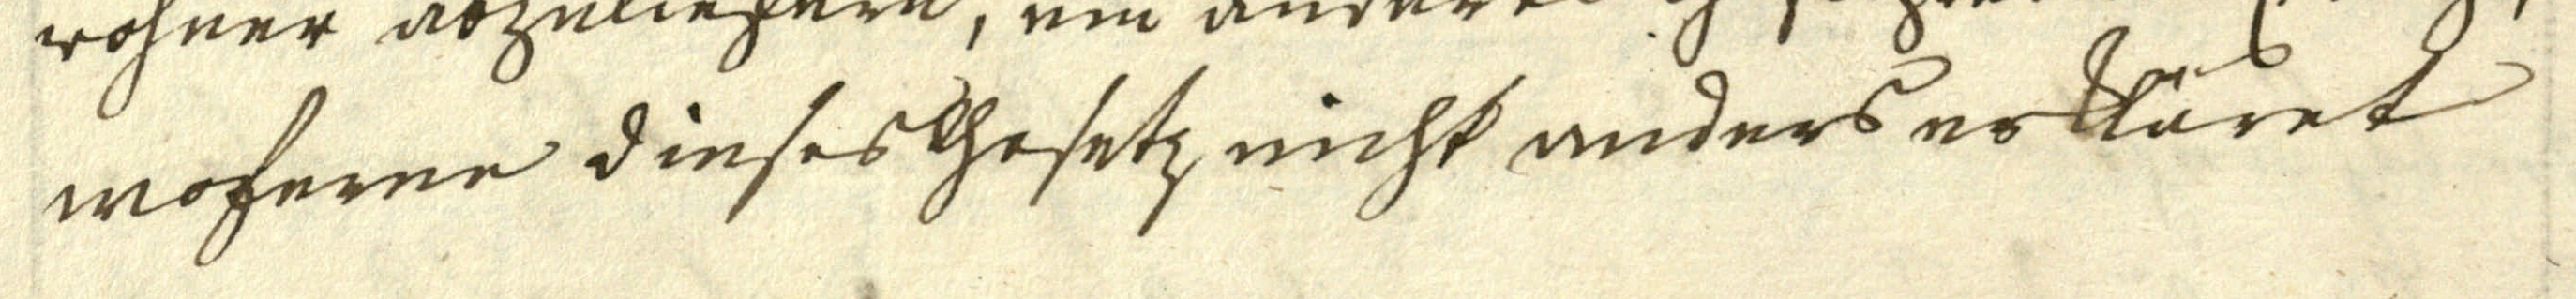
woferne dieses Gesetz nicht anders erkläret
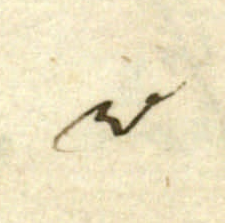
w
